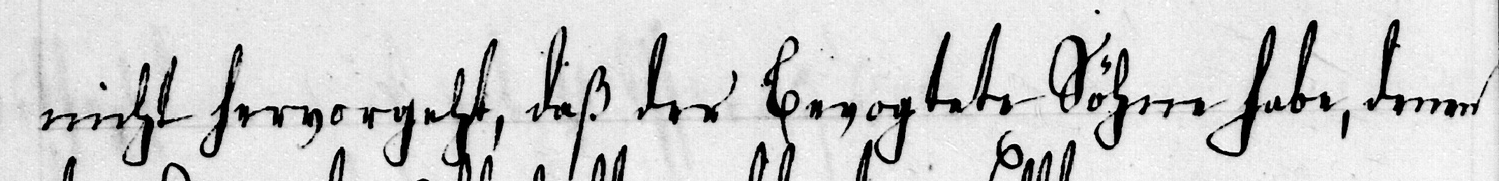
nicht hervorgeht, daß der Bevogtete Söhne habe, denen
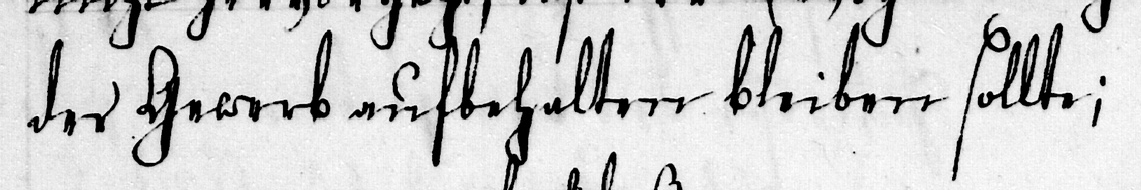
der Gewerb aufbehalten bleiben sollte;
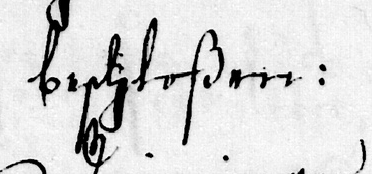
beschloßen:
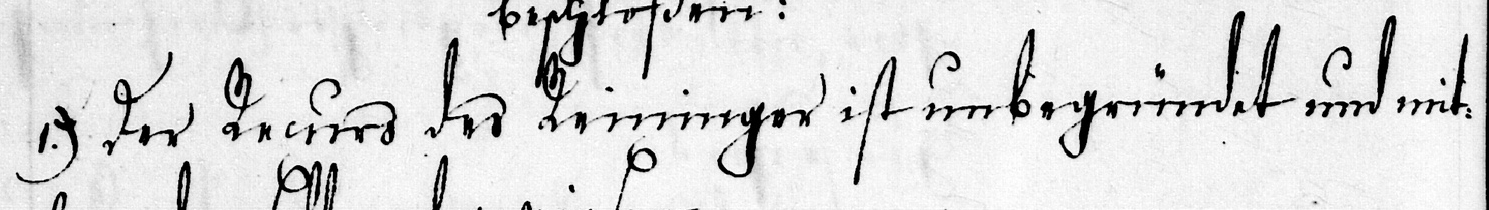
1.) Der Recurs des Reininger ist unbegründet und mit¬
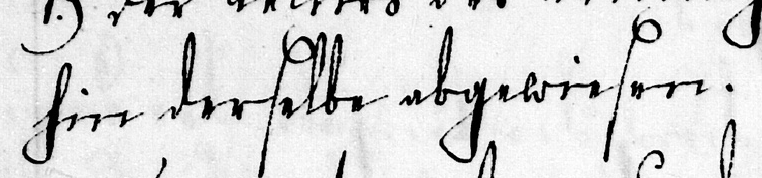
hin derselbe abgewiesen.
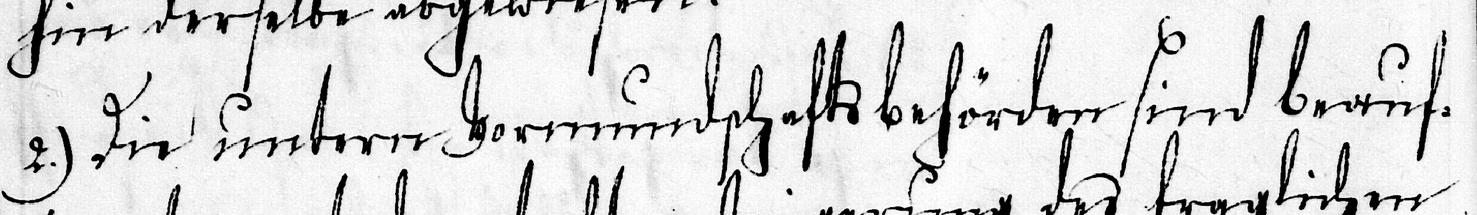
2.) Die untern Vormundschaftsbehörden sind beauf¬
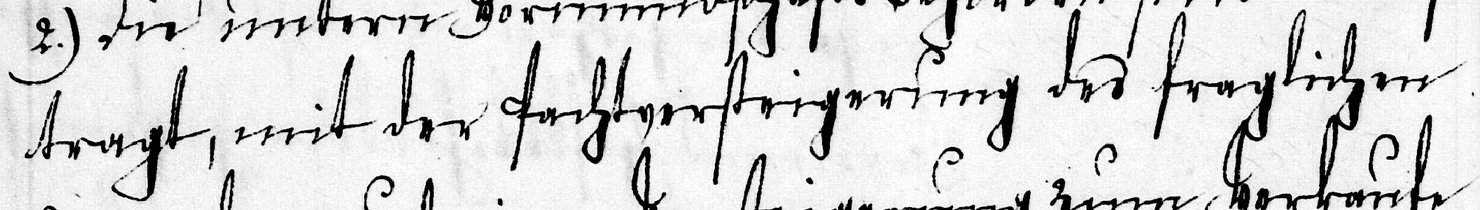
tragt, mit der Pachtversteigerung des fraglichen
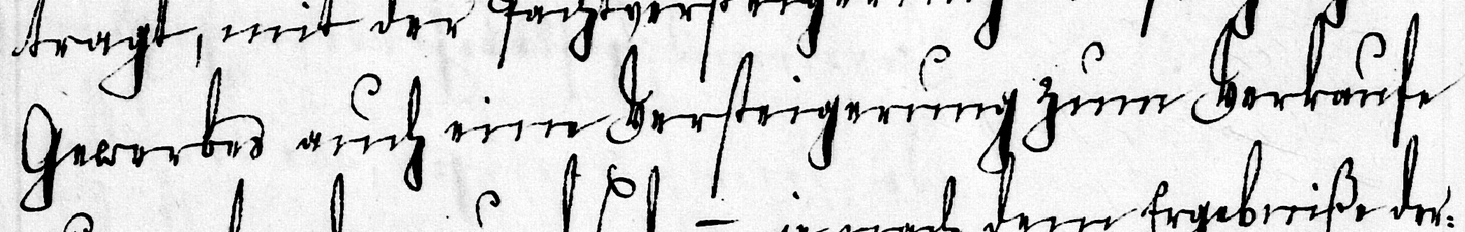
Gewerbes auch eine Versteigerung zum Verkaufe
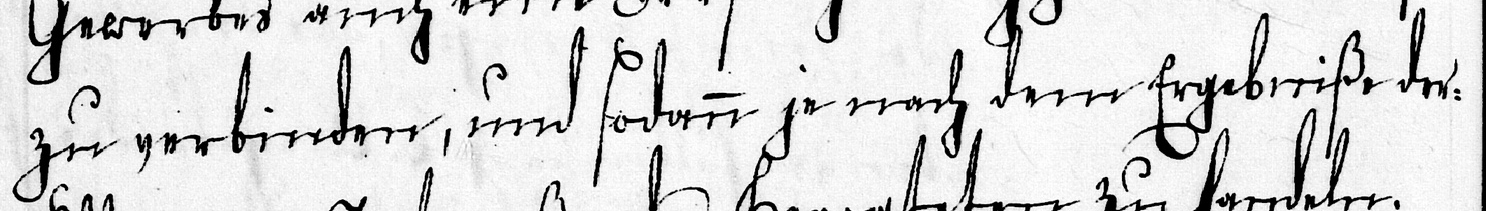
zu verbinden, und sodann je nach dem Ergebniße der¬
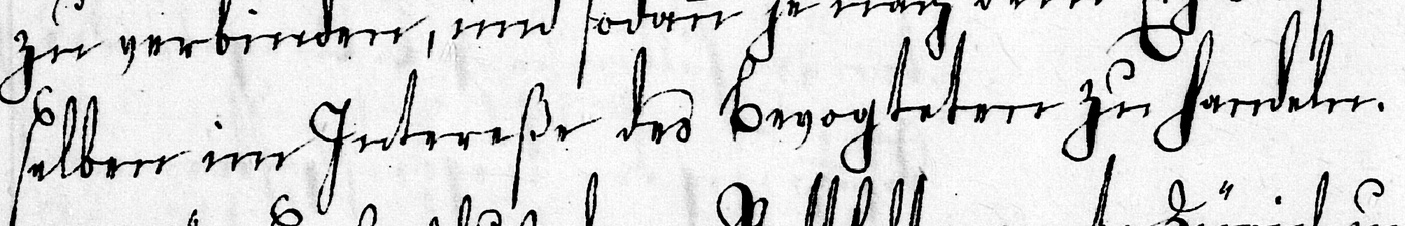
selben im Intereße des Bevogteten zu handeln.
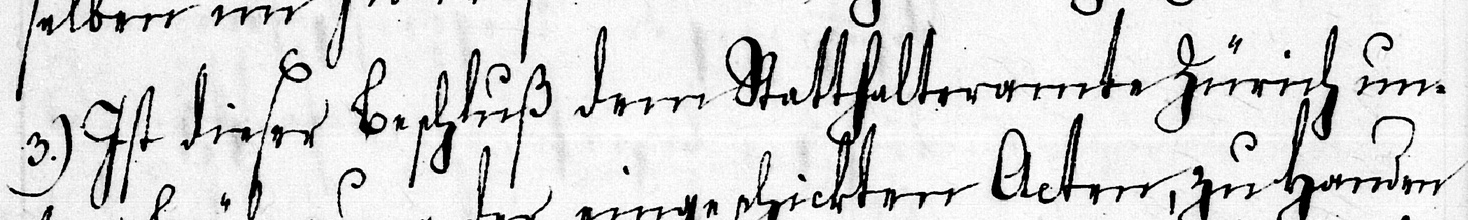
3.) Ist dieser Beschluß dem Statthalteramte Zürich un¬
